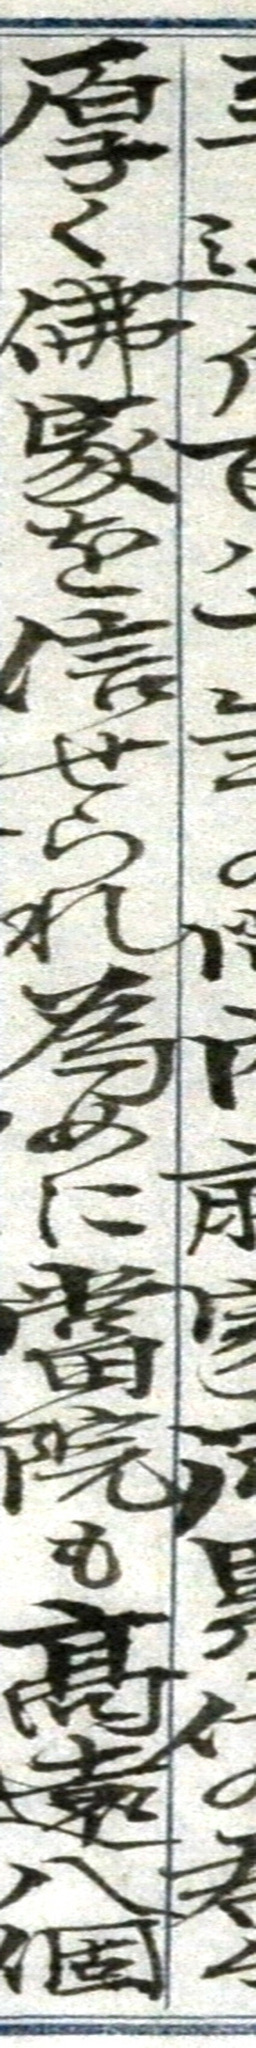厚く仏家を信せられ為めに当院も高遠八個
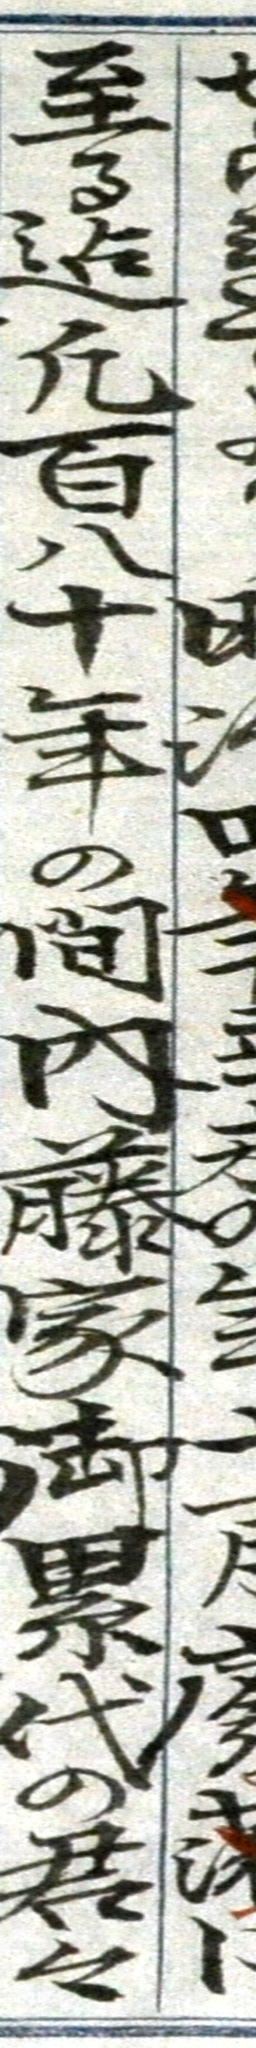至る迄凡百八十年の間内藤家御累代の君々
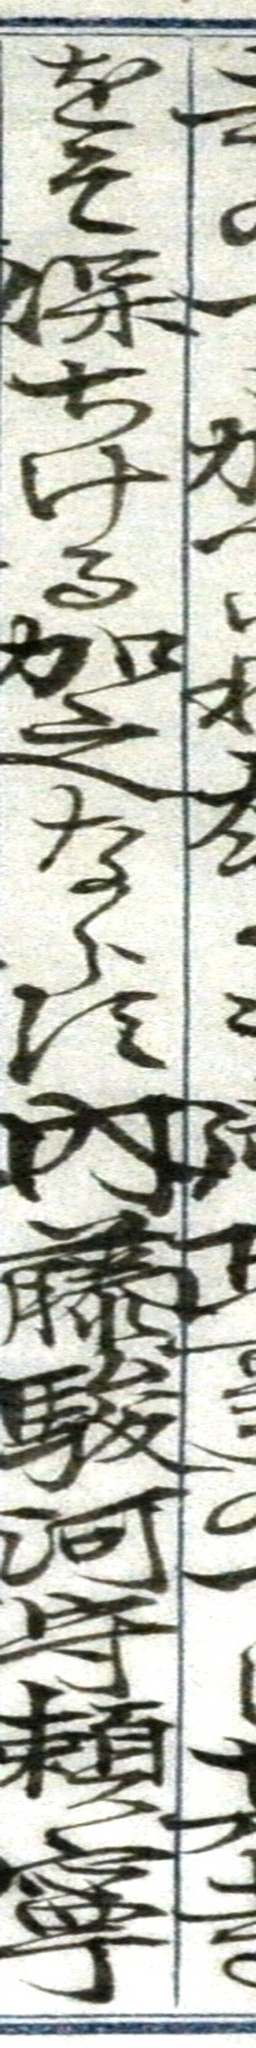をそ保ちける加之ならす内藤駿河守頼寧
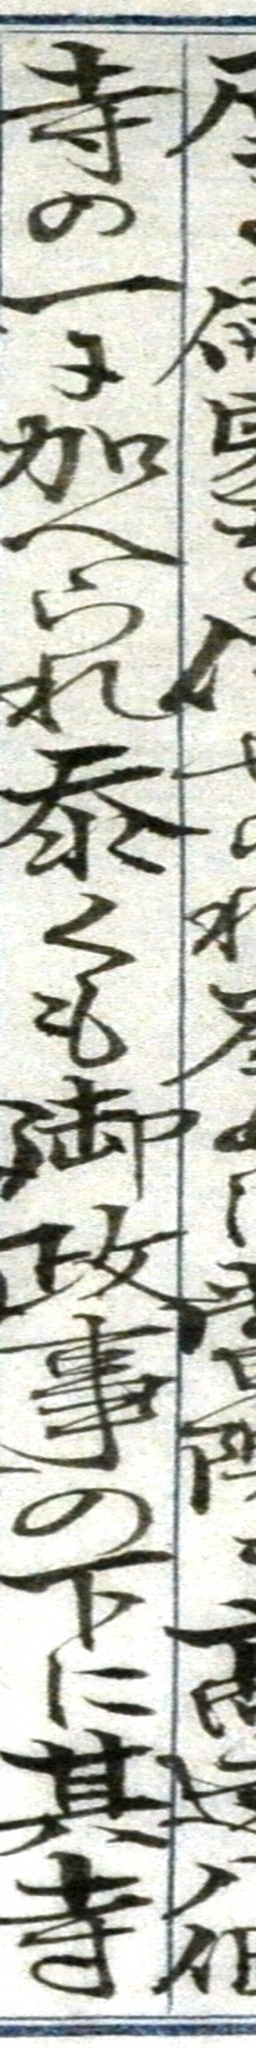寺の一に加へられ忝くも御政事の下に其寺
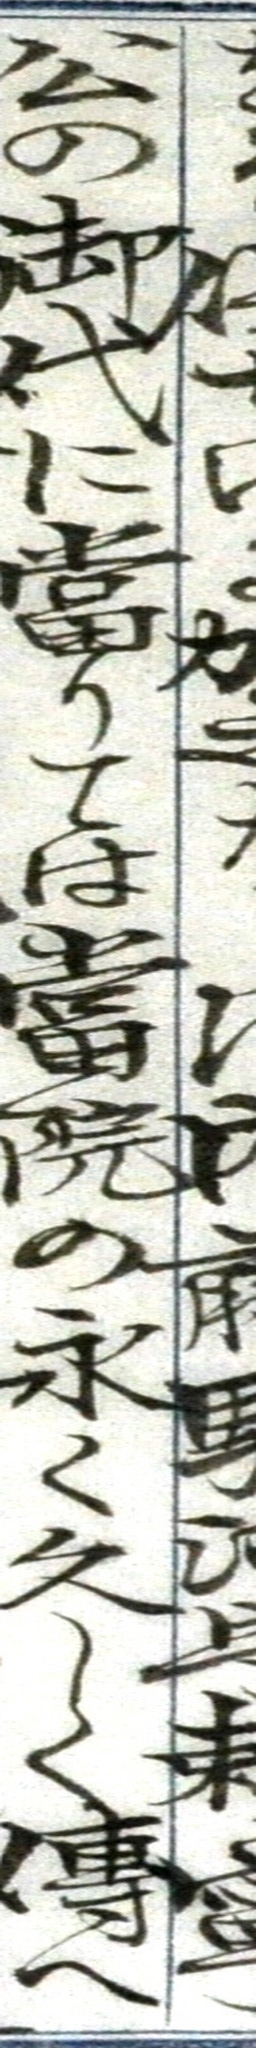公の御代に当りては当院の永く久しく伝へ
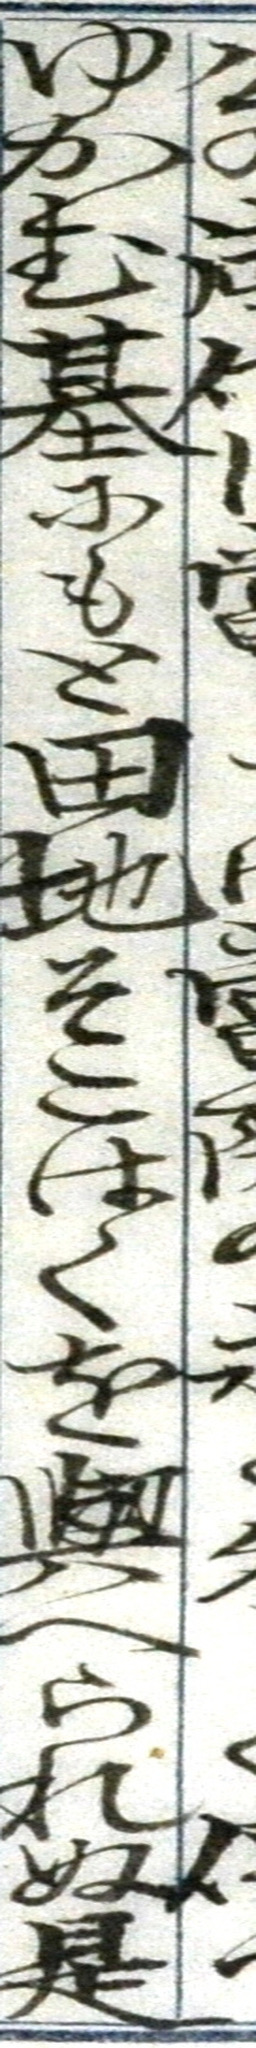ゆかむ基にもと田地そこはくを与へられぬ是
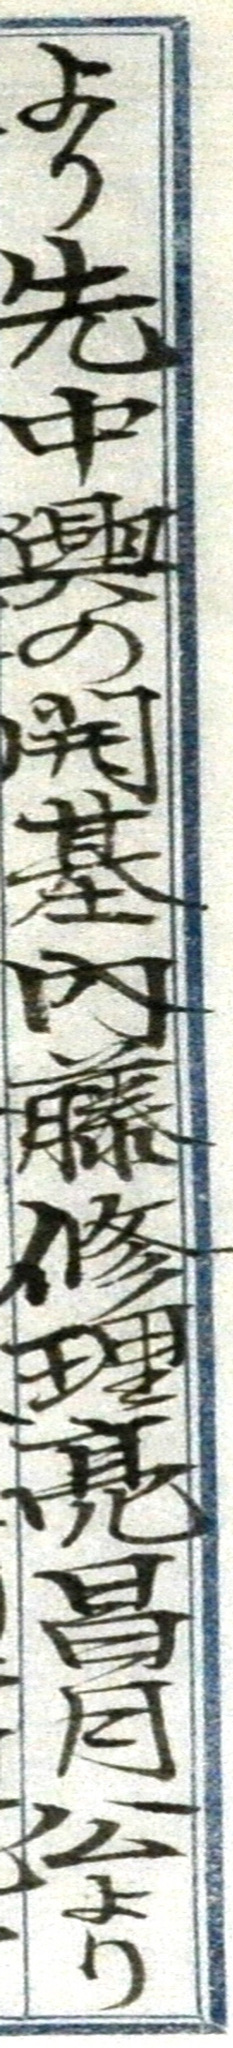より先中興の開基内藤修理亮昌月公より
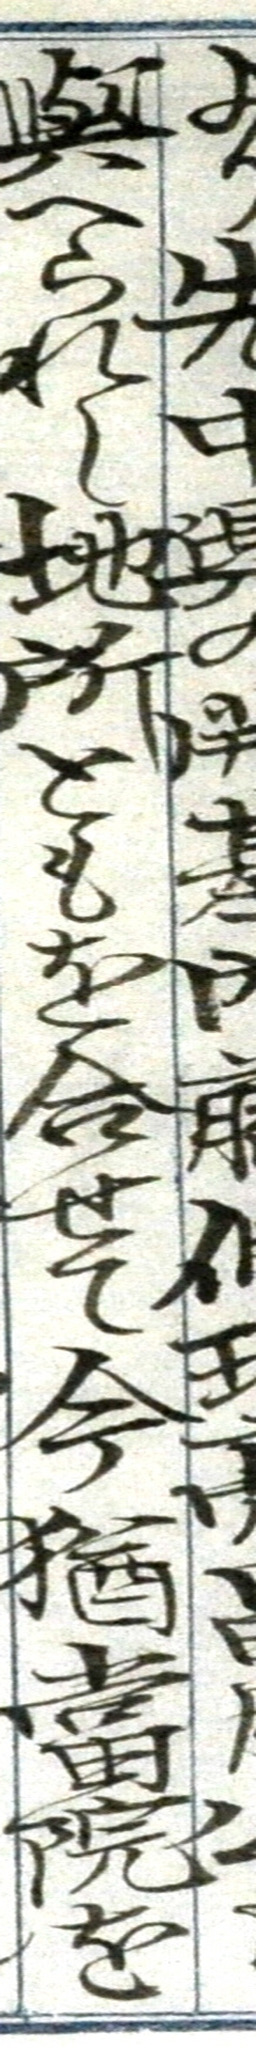与へられし地所ともを合せて今猶当院を
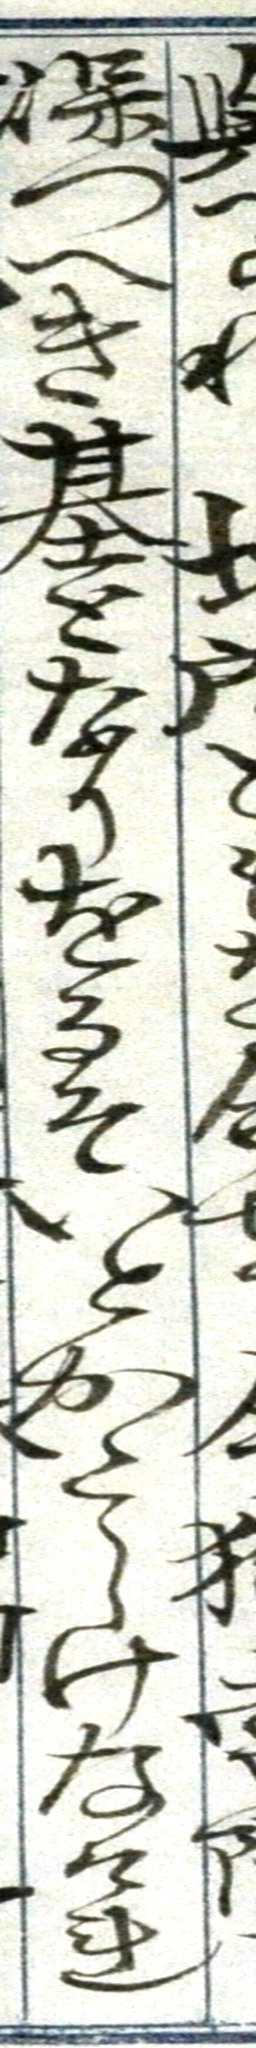保つへき基となりをるそいとかたしけなけれ
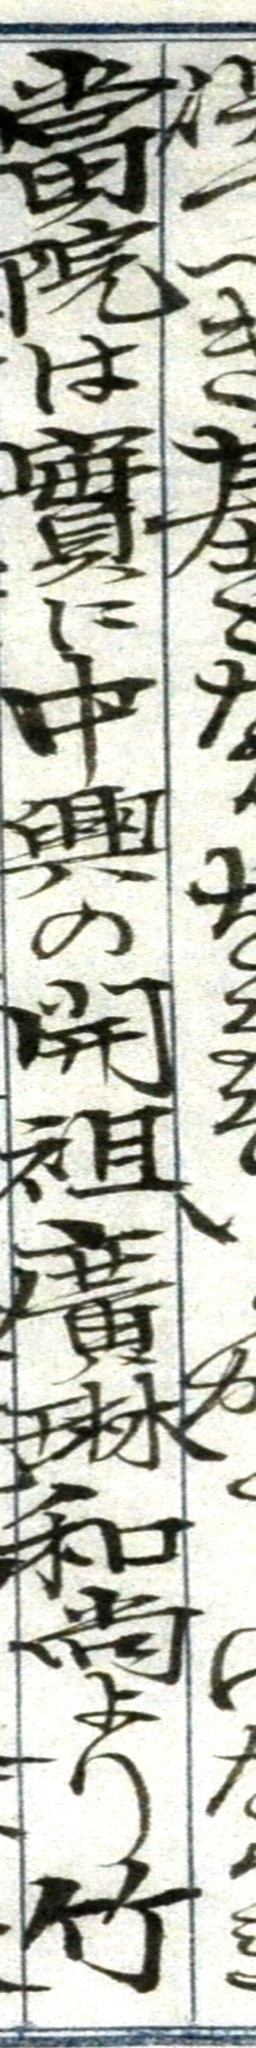当院は実に中興の開祖広琳和尚より竹
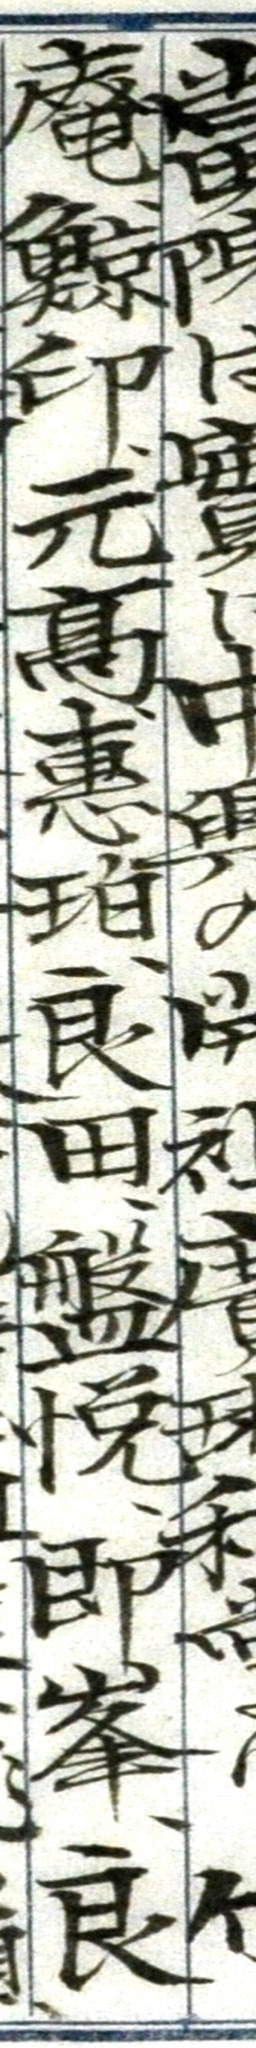庵鯨印、元高、恵珀、良田、盤悦、即峯、良
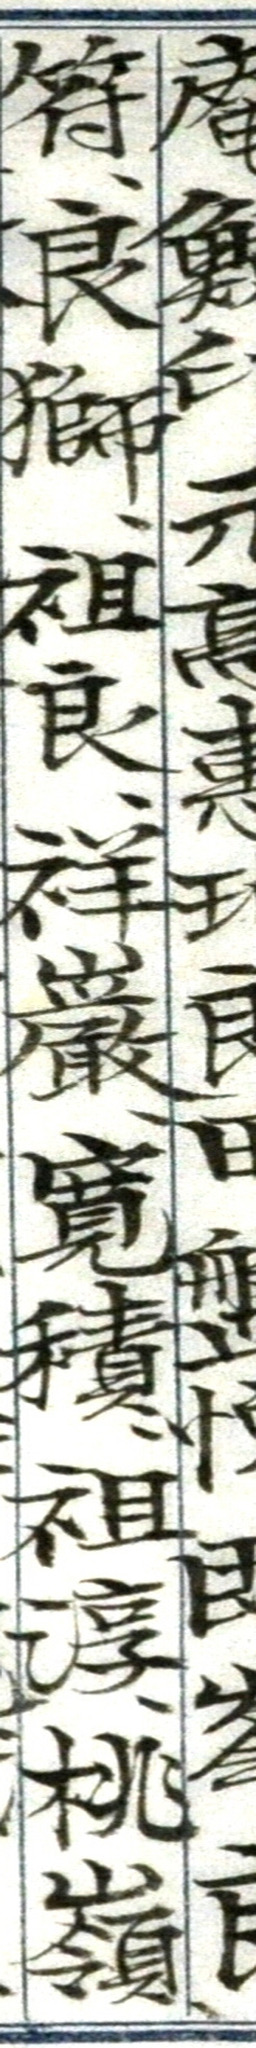符、良獅、祖良、祥巌、寛積、祖淳、桃嶺、
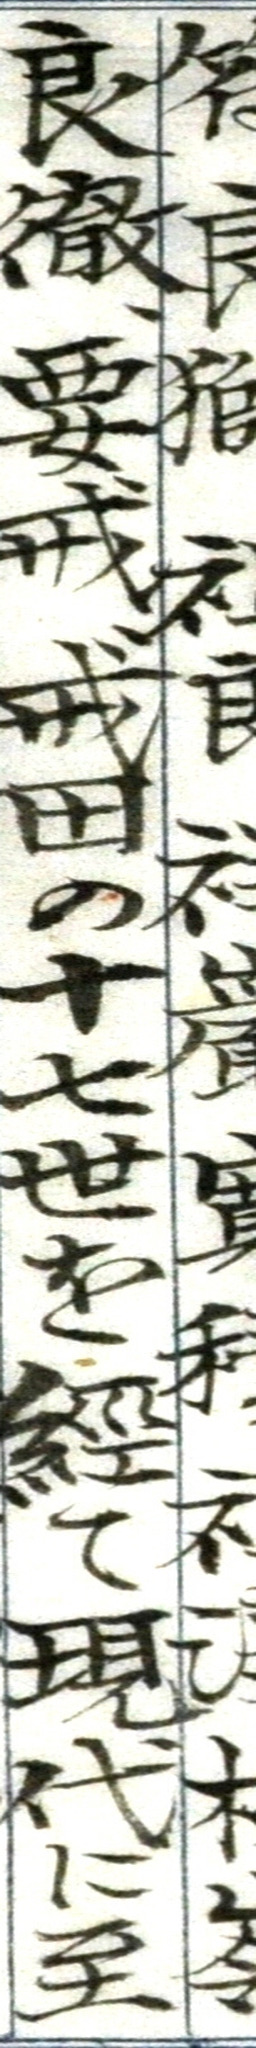良徹、要戒、戒田の十七世を経て現代に至
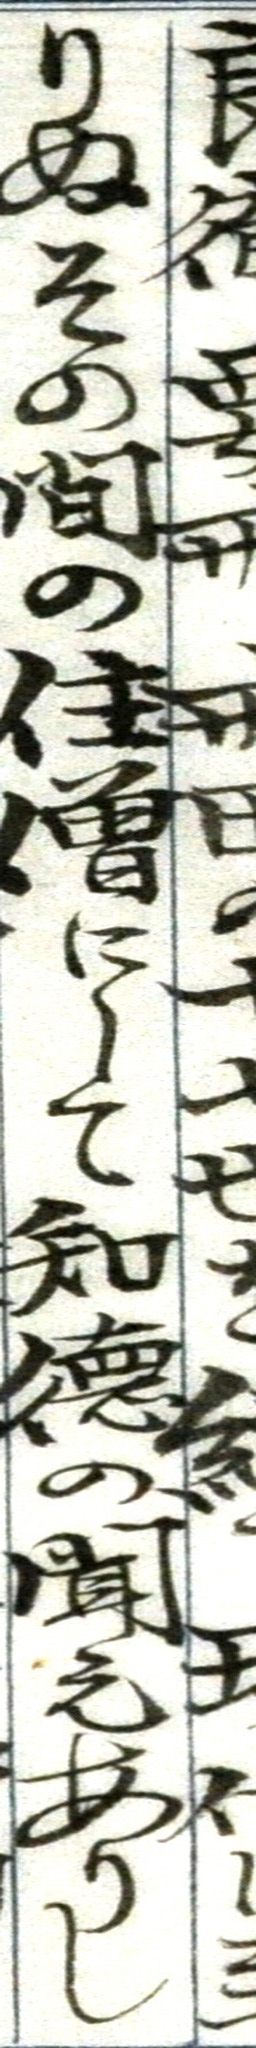りぬその間の住僧にして知徳の聞えありし
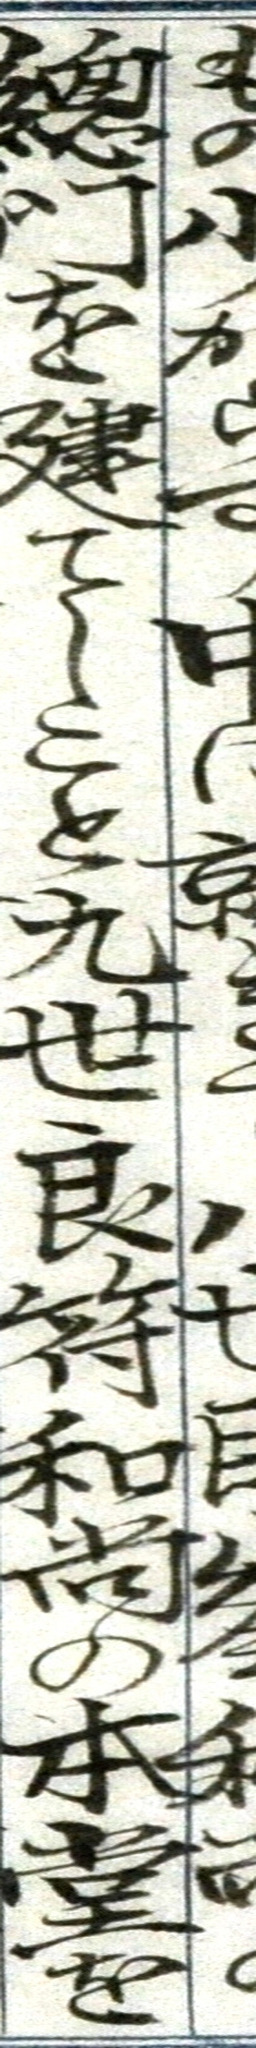総門を建てしこと九世良符和尚の本堂を
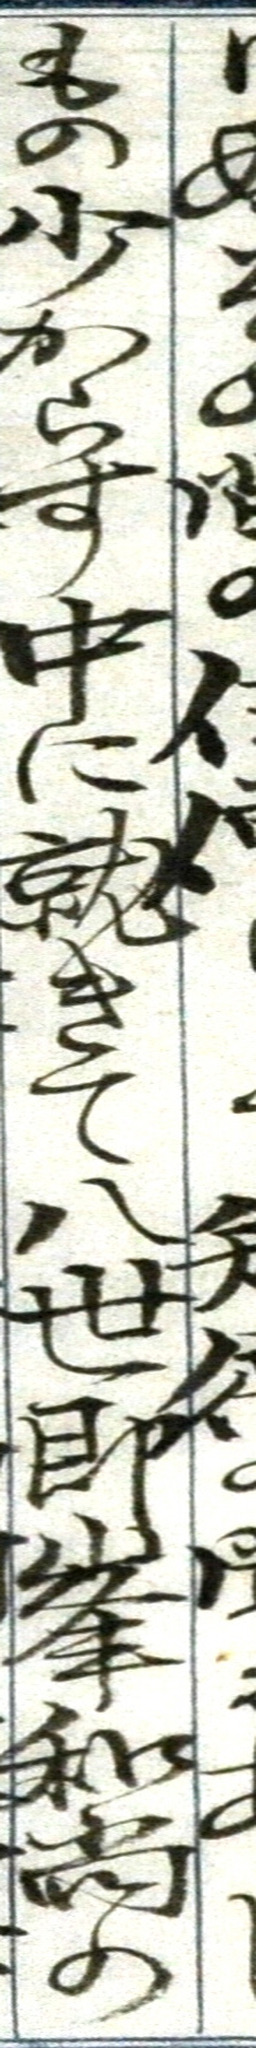もの少からす中に就きて八世即峯和尚の
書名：桂泉院・樹林寺・東光寺縁起書、蓮華寺由来書、付夕顔観音記
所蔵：伊那市立高遠町図書館・合同会社AMANE
